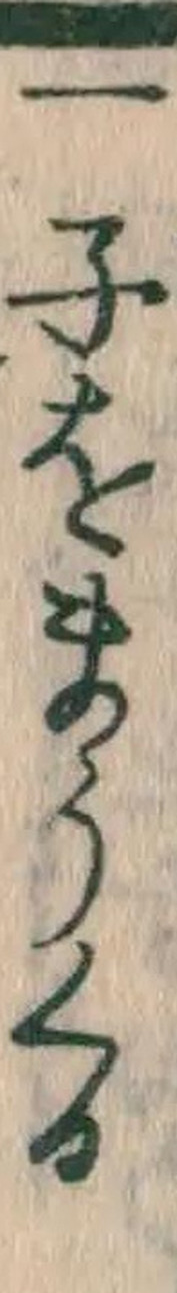一子をまうくる
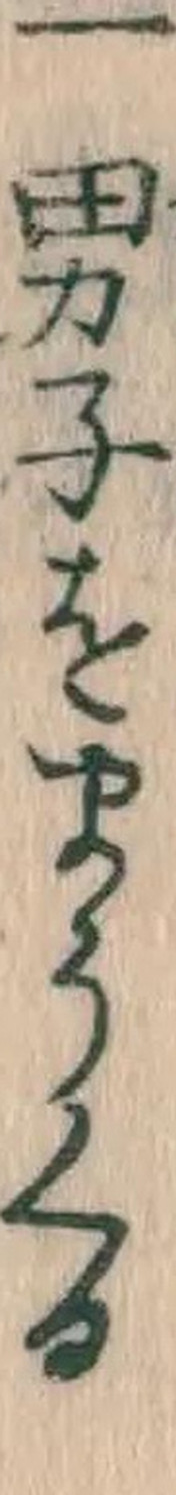一男子をまうくる
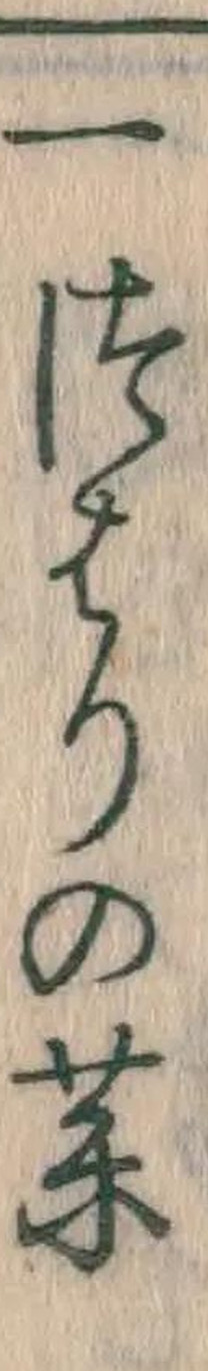一つはりの薬
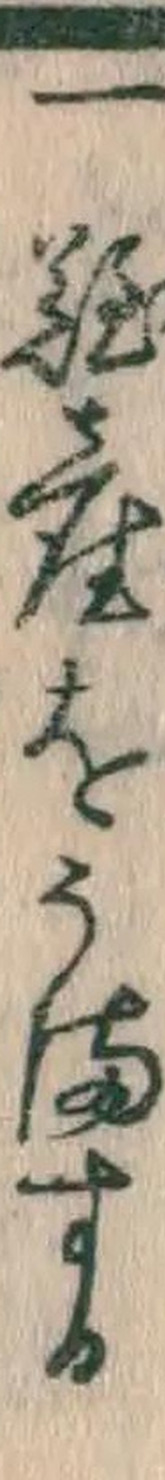一難産をうまする
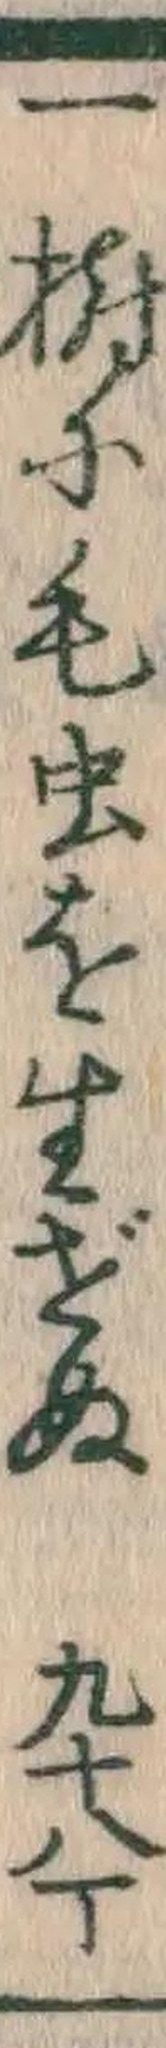一樹に毛虫を生ぜぬ九十八丁
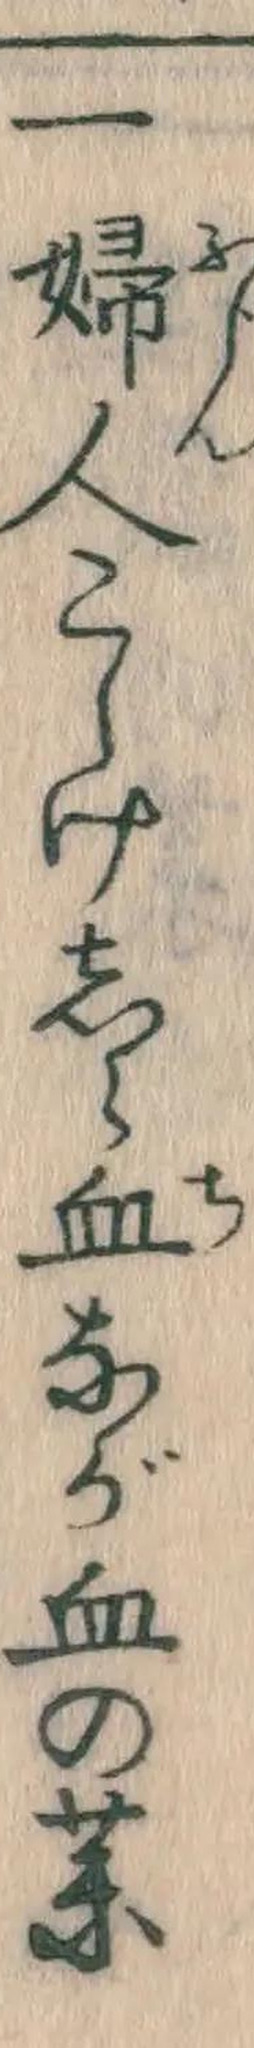一婦人こしけしら血なが血の薬
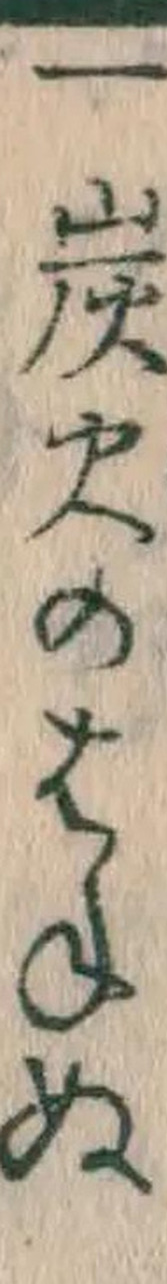一炭火のはねぬ
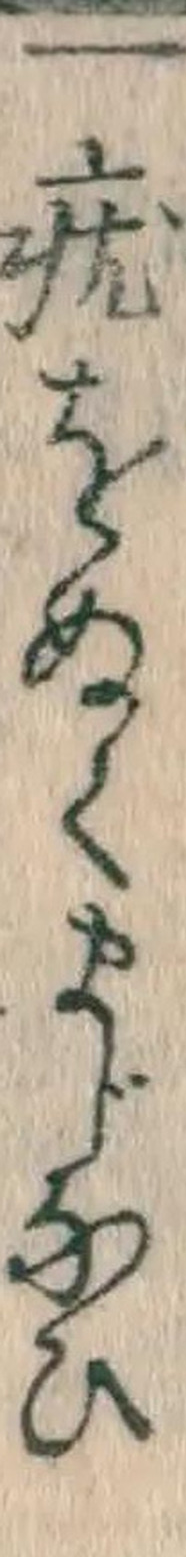一疣をぬくまじなひ
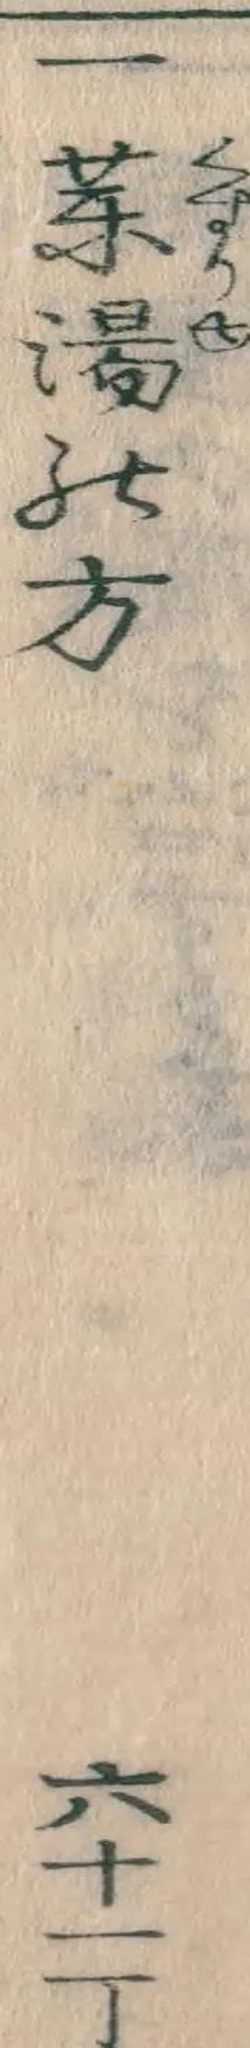一薬湯の方六十一丁
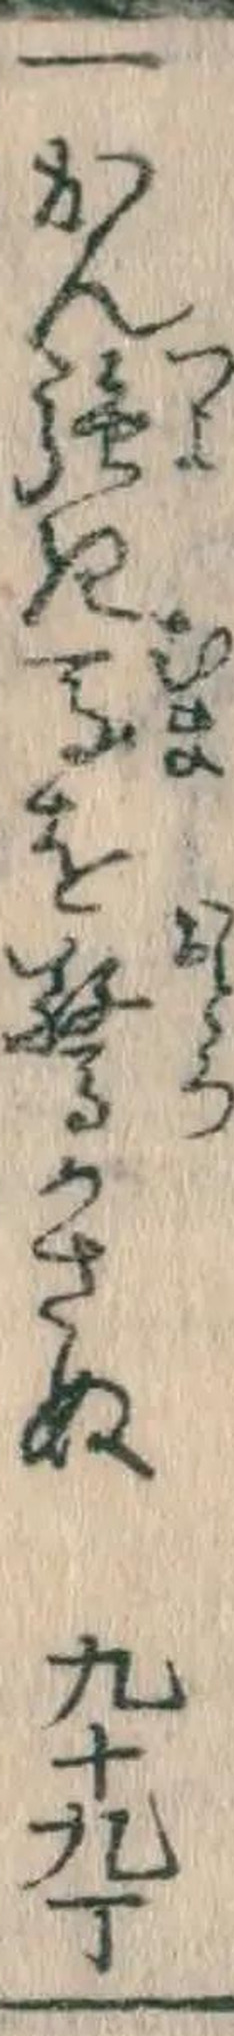一かん強き馬を驚かさぬ九十九丁
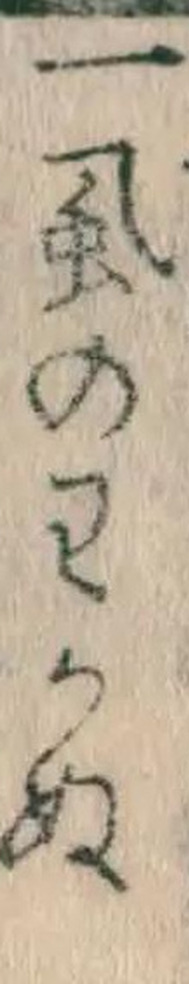一虱のわかぬ
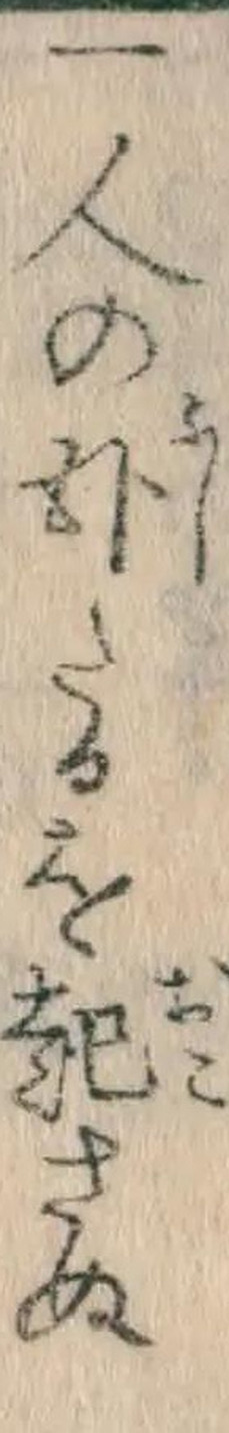一人の臥たるを起さぬ
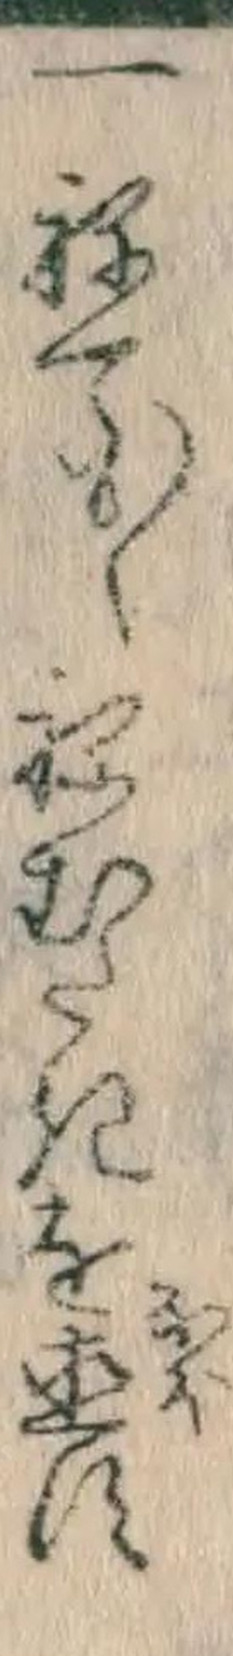一ねても〳〵ねむたきを直す
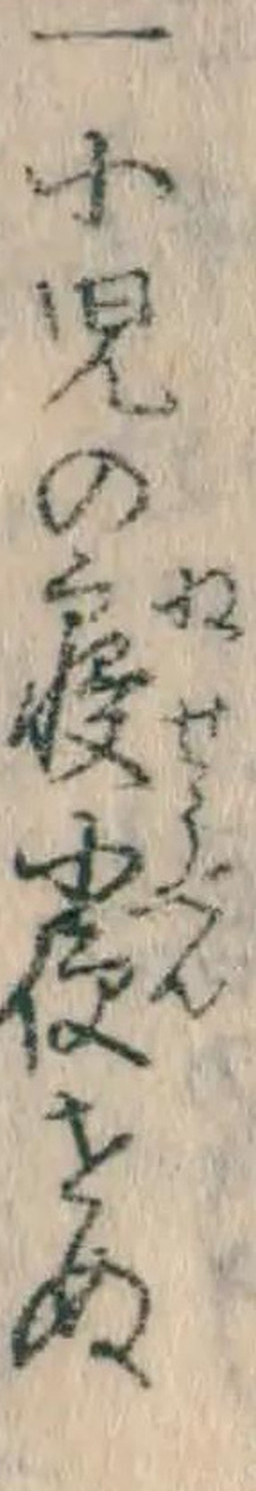一小児の寝小便せぬ
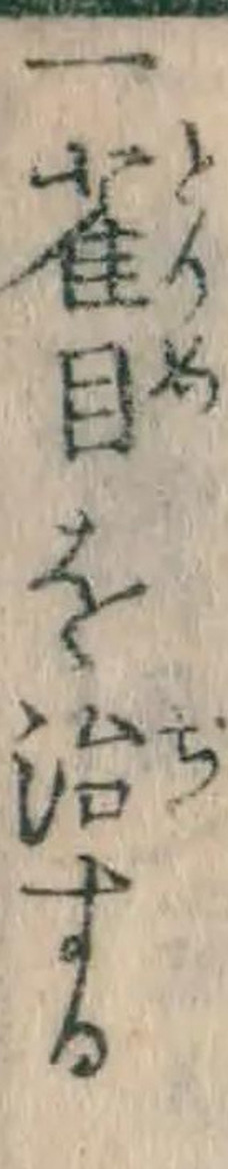一雀目を治する

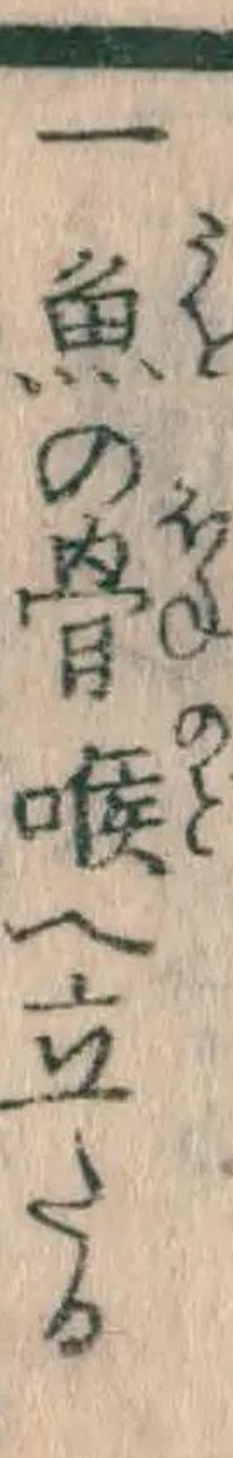一魚の骨喉へ立たる
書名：広益秘事大全 3巻. [1]
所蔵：国立国会図書館 National Diet Library, JAPAN
